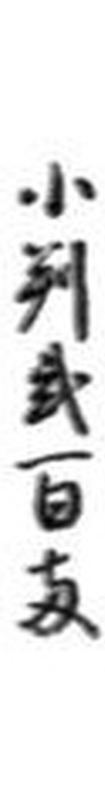小判弐百両
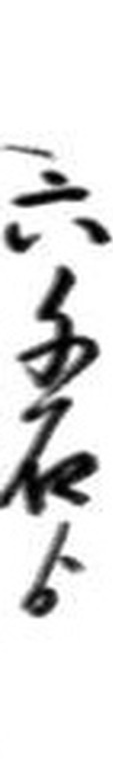六千石ゟ
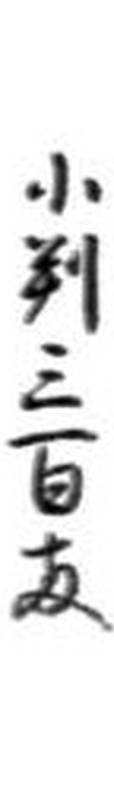小判五百両
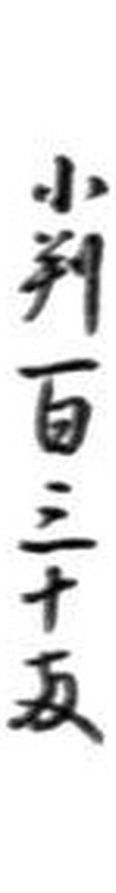小判百三十両
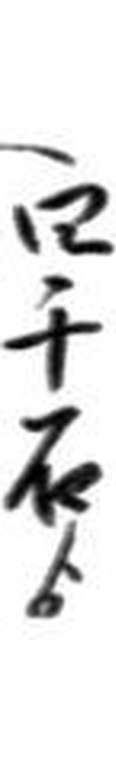四千石ゟ
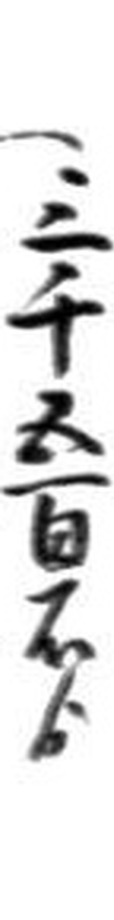三千五百石ゟ

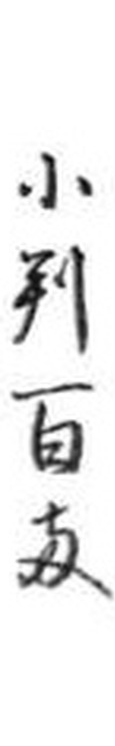小判百両
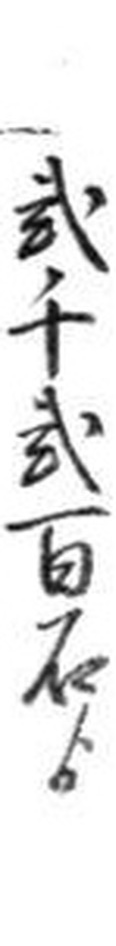弐千弐百石ゟ
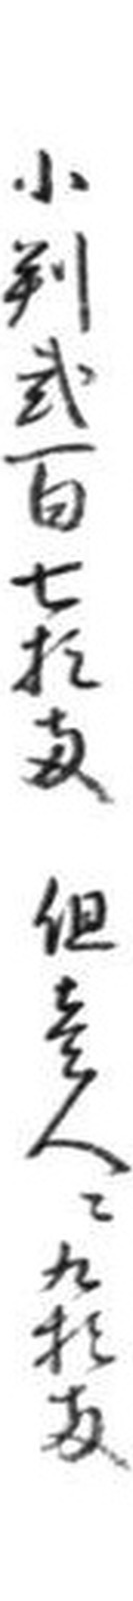小判弐百七拾両但壱人ニ九拾両
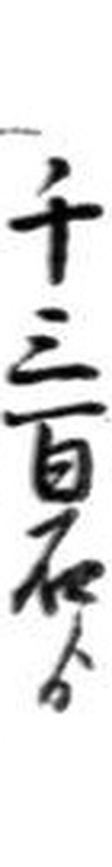千三百石ゟ
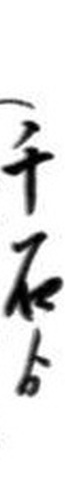千石ゟ
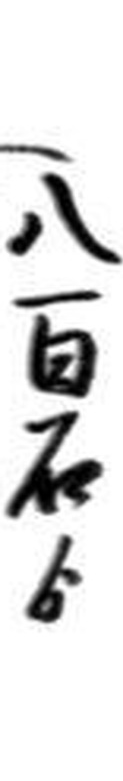八百石ゟ
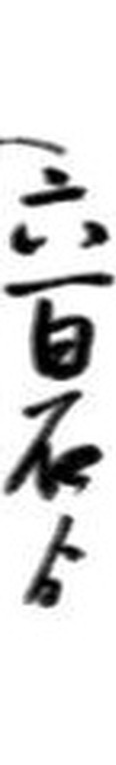六百石ゟ
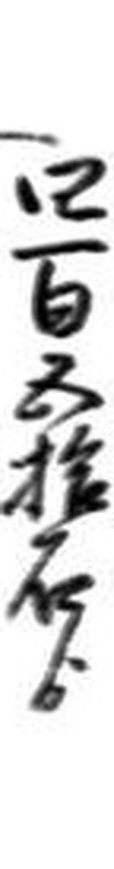四百五拾石ゟ
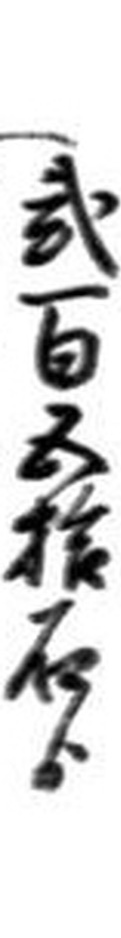弐百五拾石ゟ

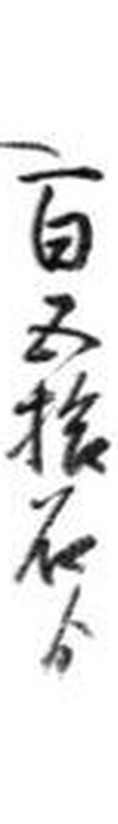百五拾石ゟ
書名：家譜 七 光通公 従寛文四年到同九年
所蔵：福井県文書館 Fukui Prefectural Archives
